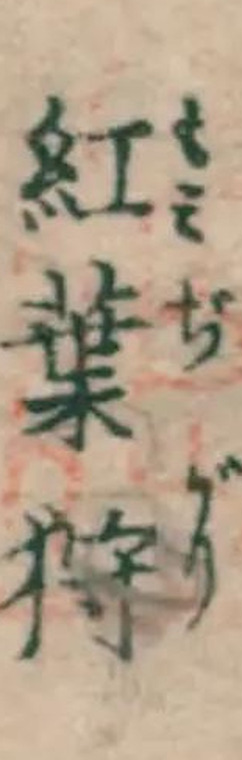紅葉狩
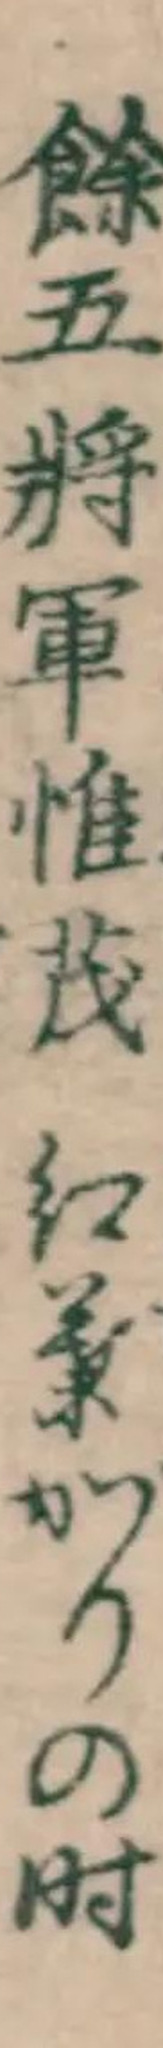余五将軍維茂紅葉がりの時
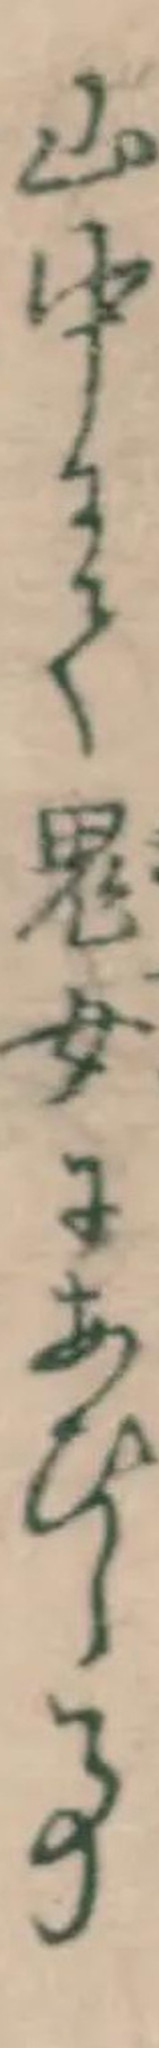山中にて鬼女にあひし事
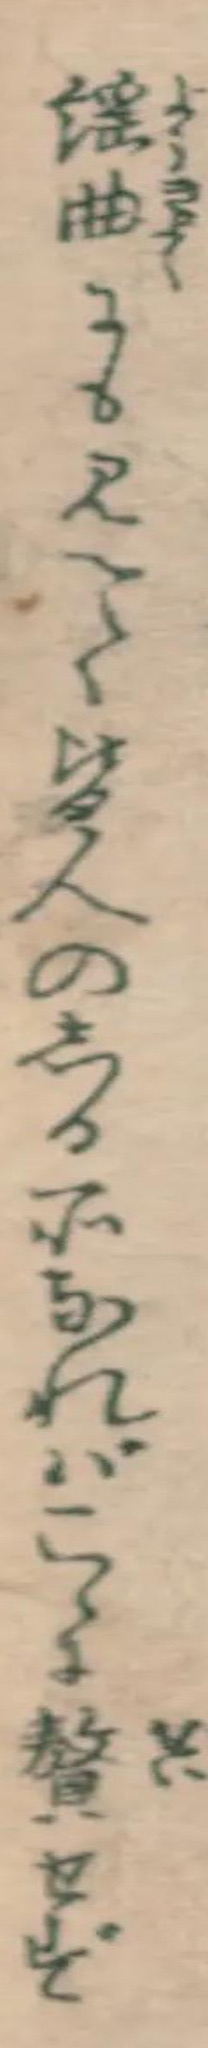謡曲にも見へて皆人のしる所なればこゝに贅せず
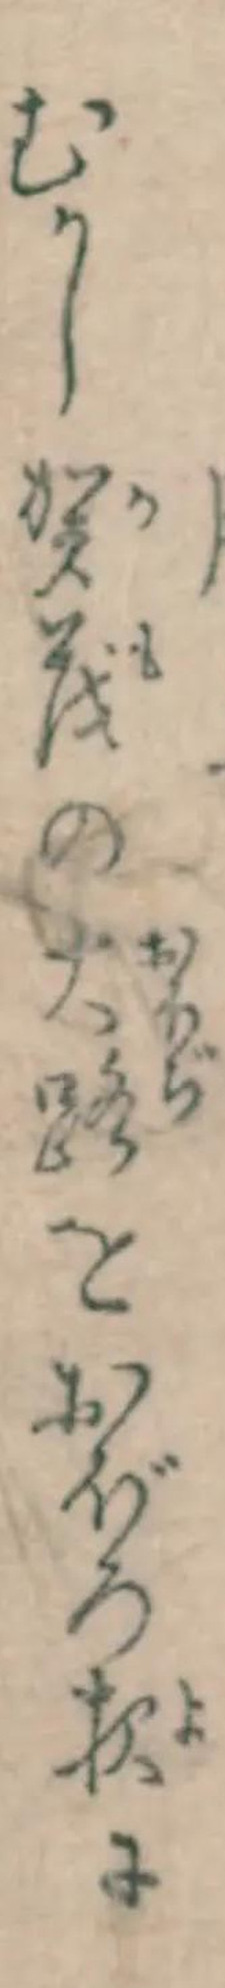むかし加茂の大路をおぼろ夜に
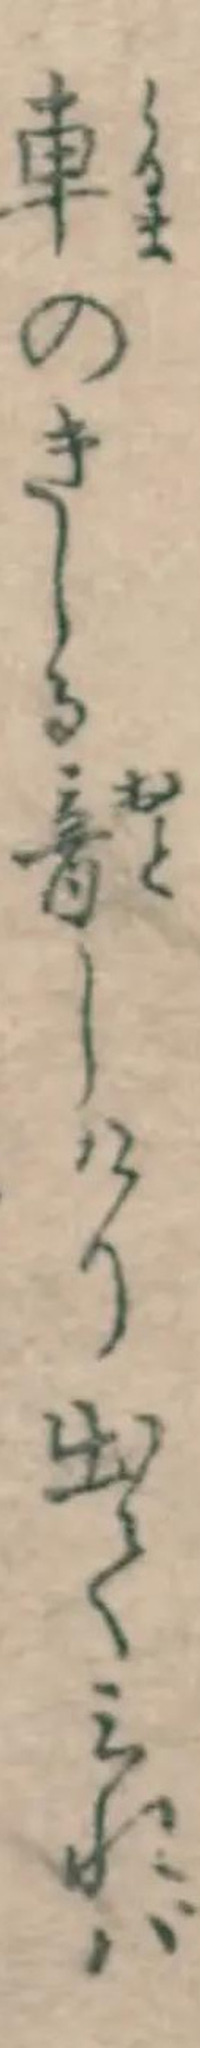車のきしる音しけり出てみれば
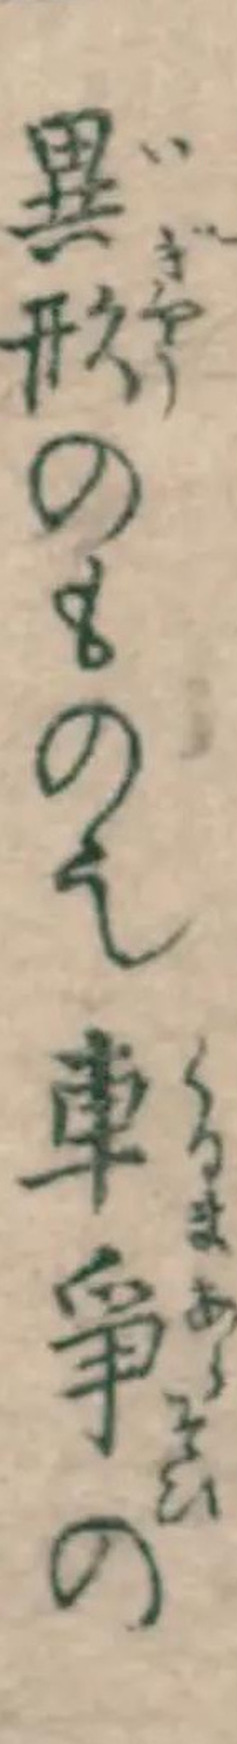異形のもの也車争の
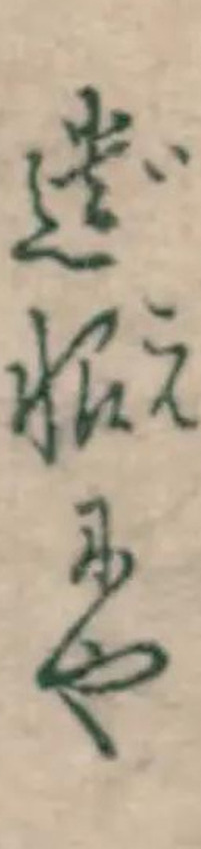遺恨にや

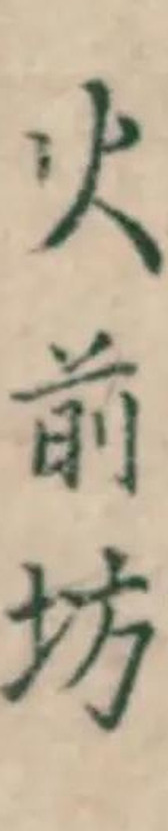火前坊
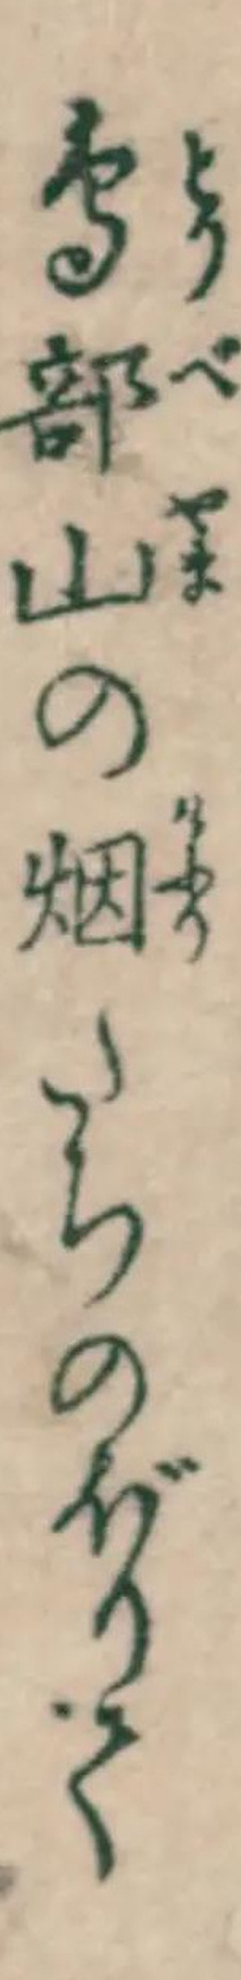鳥部山の烟たちのぼりて
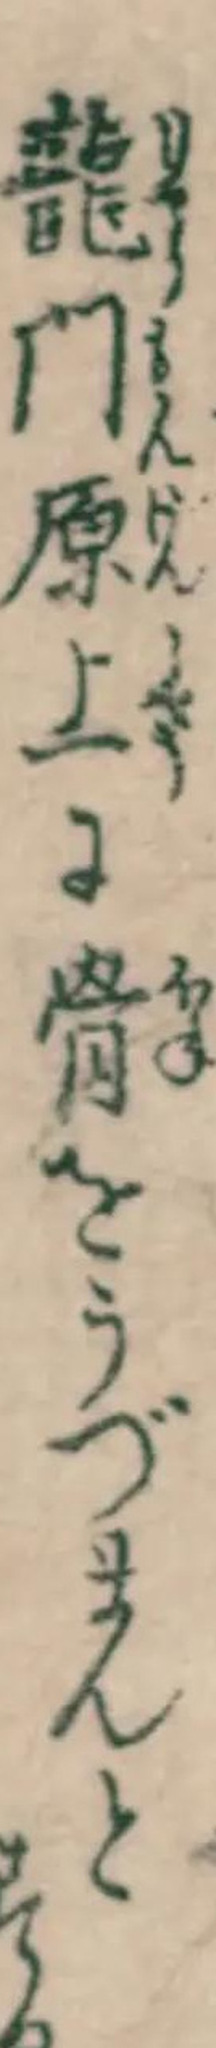龍門原上に骨をうづまんと
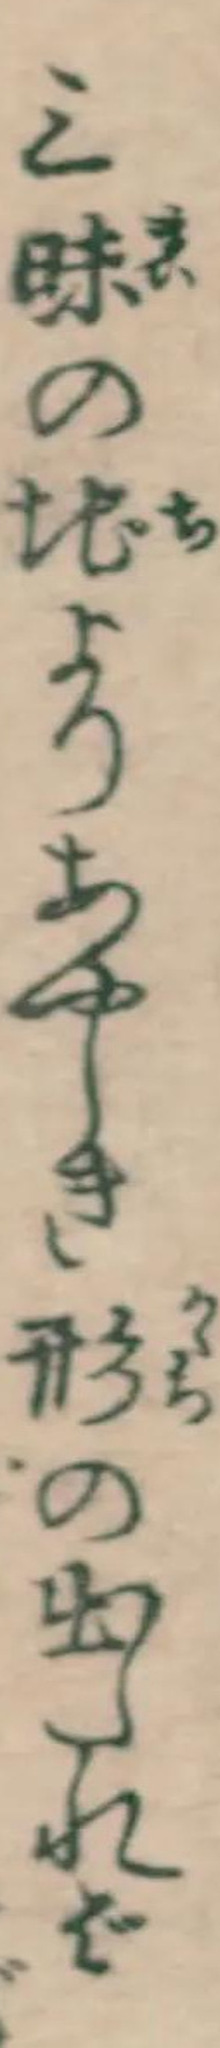三昧の地よりあやしき形の出たれば
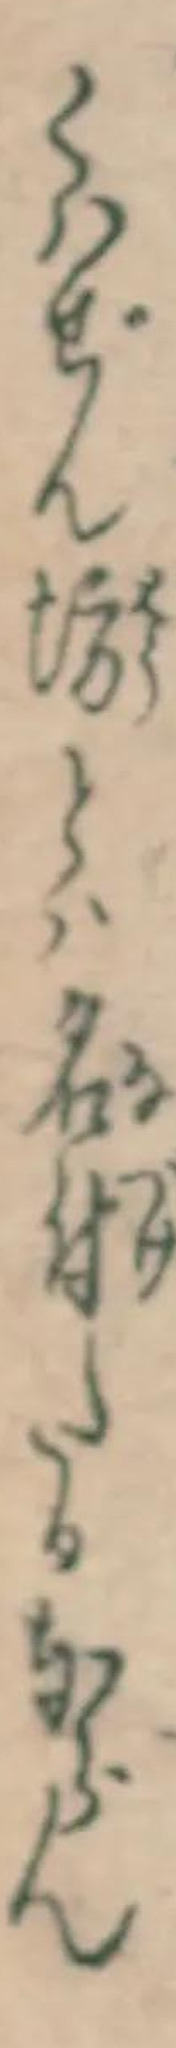くはぜん坊と名付たるならん
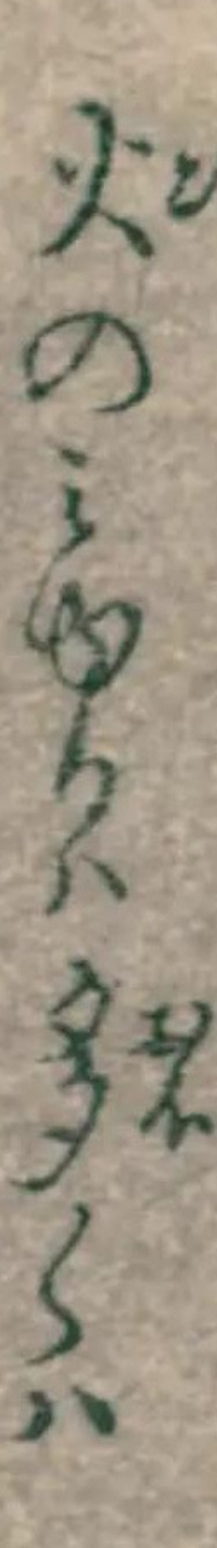火のみゆるは多くは
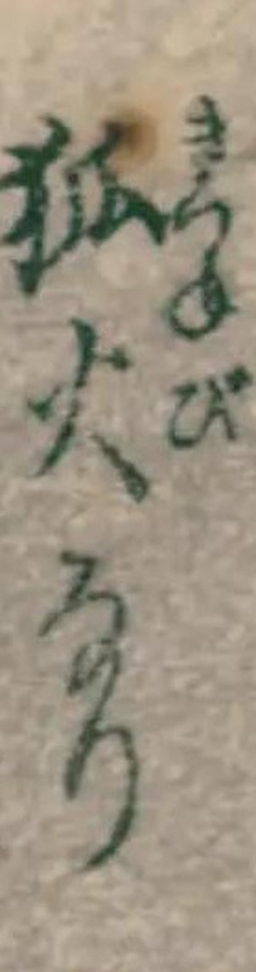狐火なり
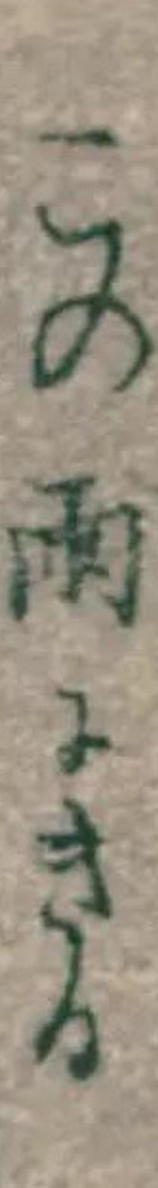この雨にきる
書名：百鬼夜行 3巻拾遺3巻. [2]
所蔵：国立国会図書館 National Diet Library, JAPAN
